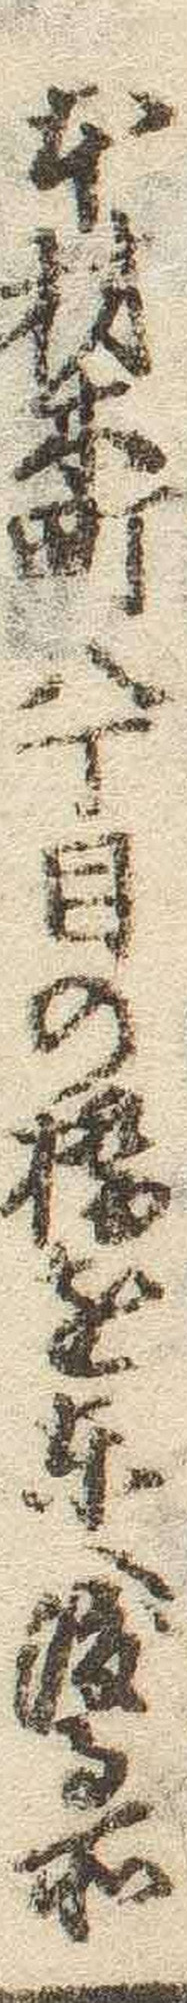本材木町八町目の橋を東へ渡る所
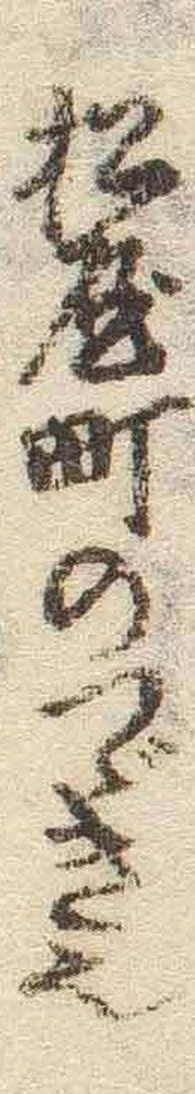松屋町のつゞき也
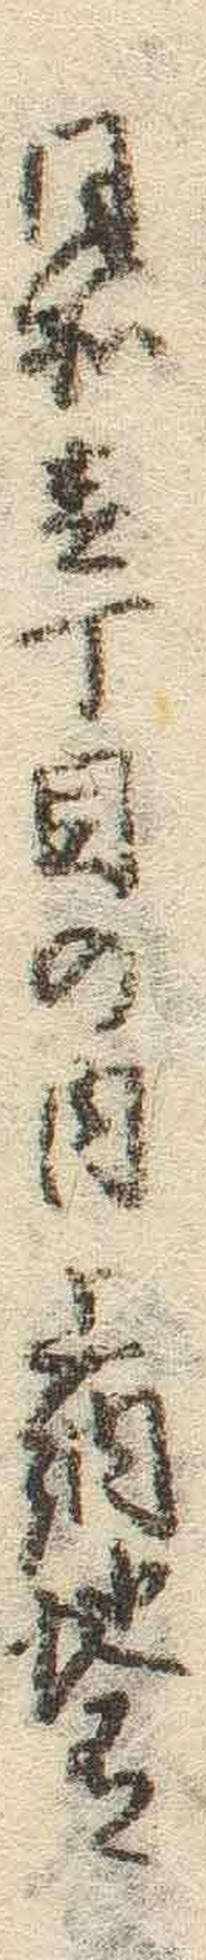同所壱丁目の内上納地有
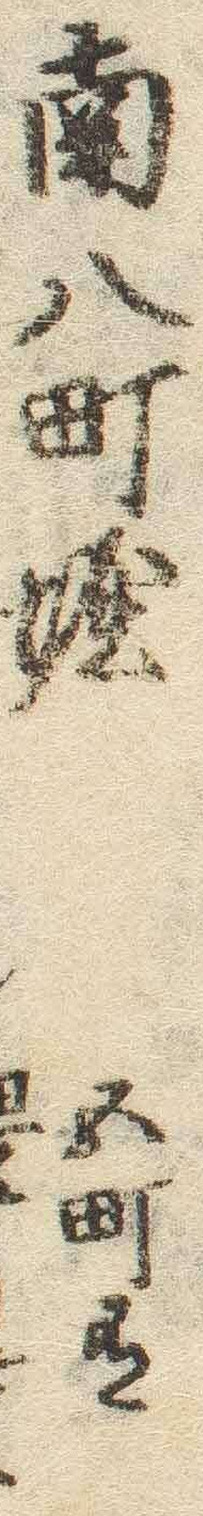南八町堀五町有
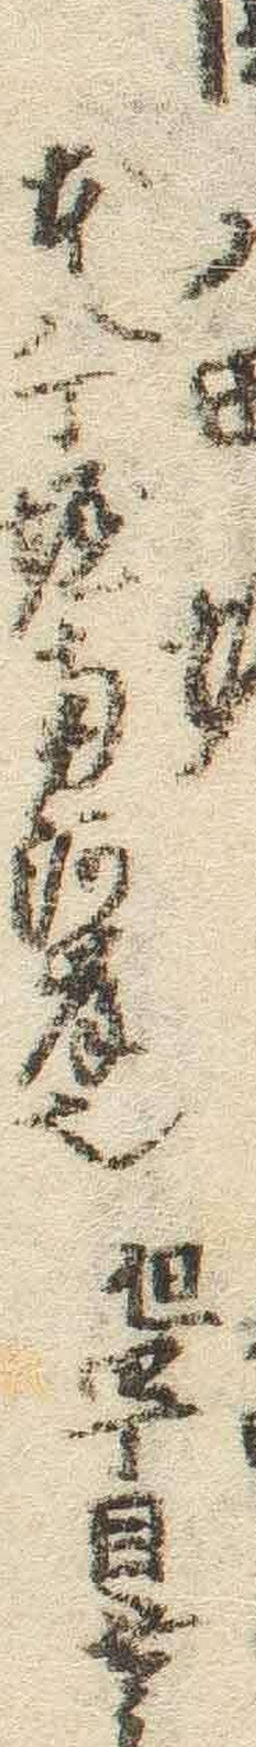本八丁堀南河岸也但四丁目無之
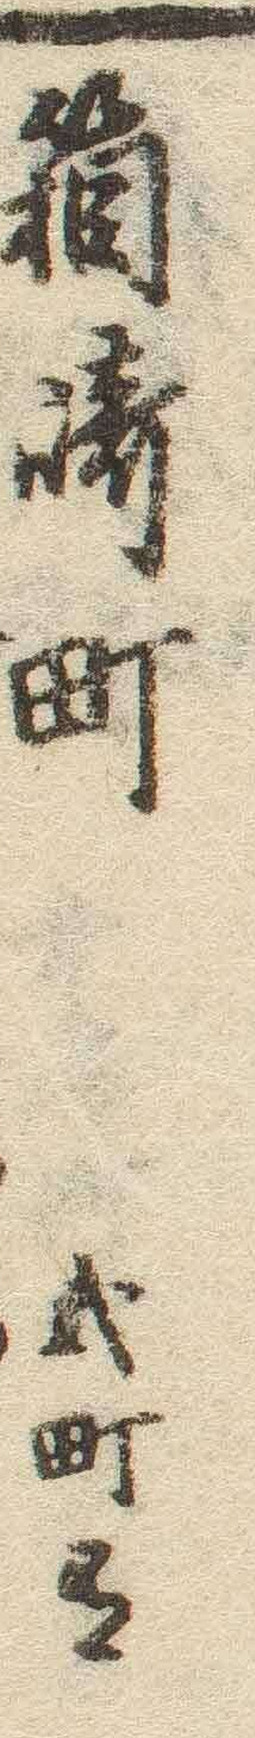箱崎町弐町有
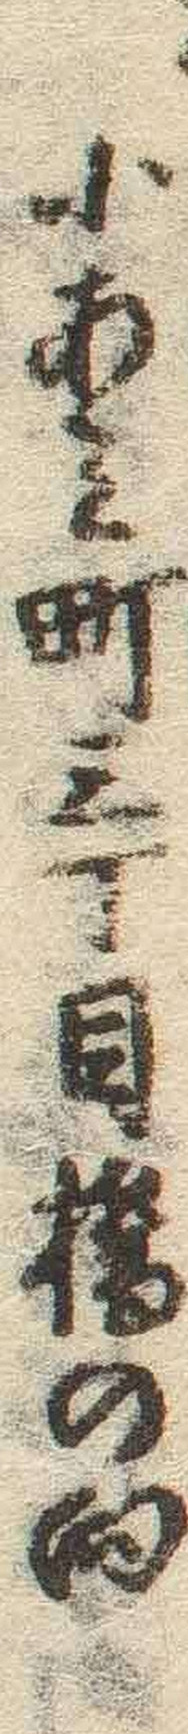小あみ町三丁目橋の向
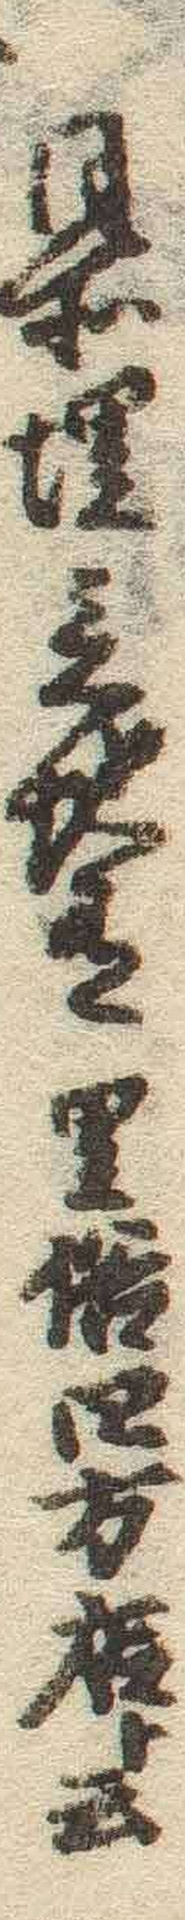同所埋立地有里俗四方店と云
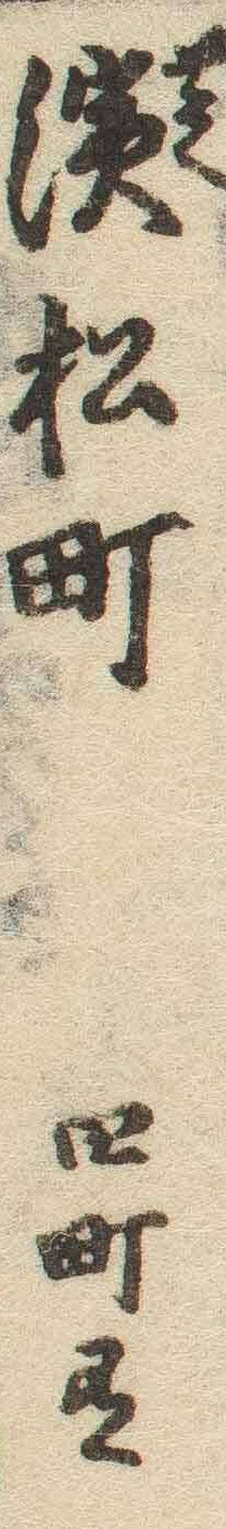浜松町四町有

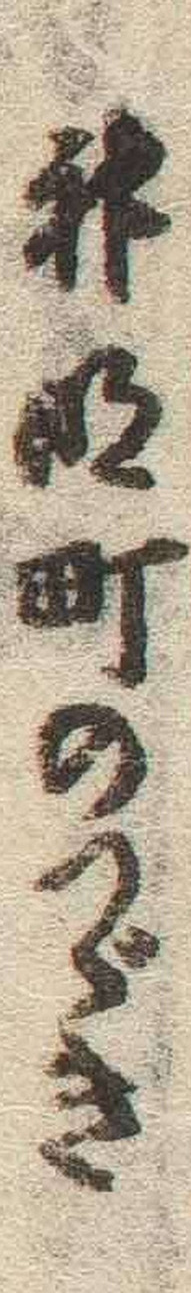神明町のつゞき
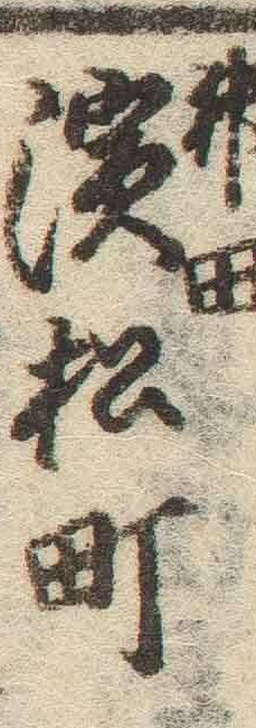浜松町
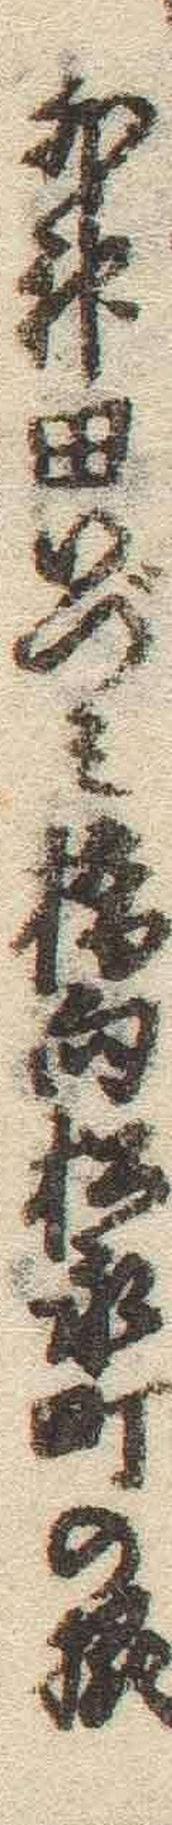外神田いづみ橋向松永町の脇
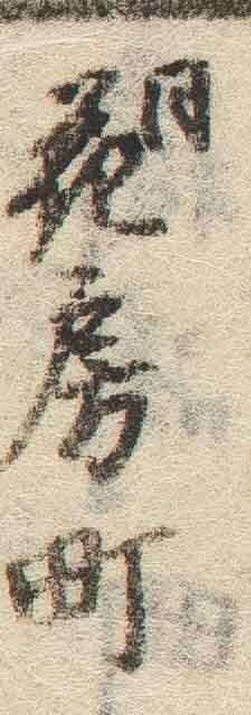花房町
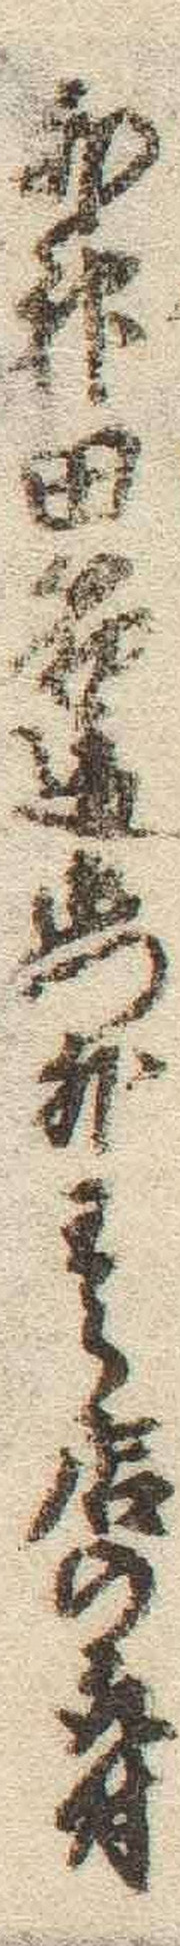外神田筋違御門外わら店の取付
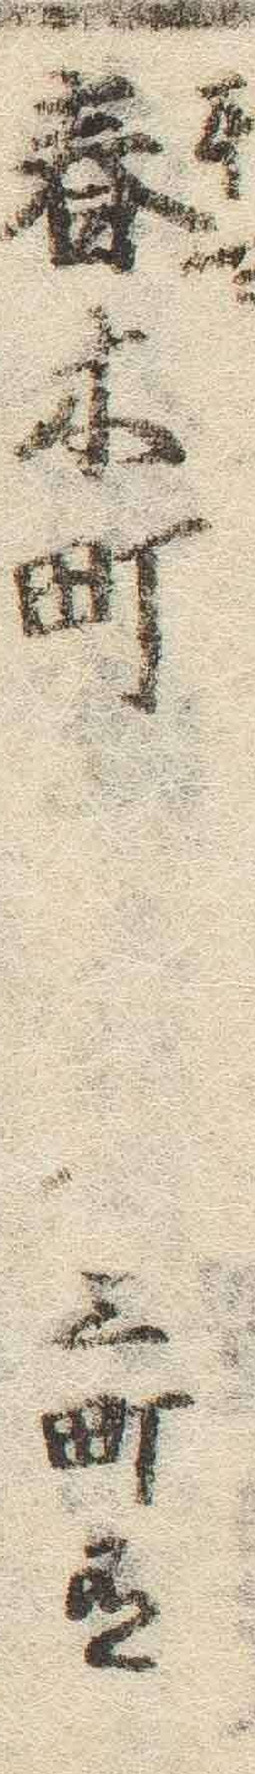春木町三町有
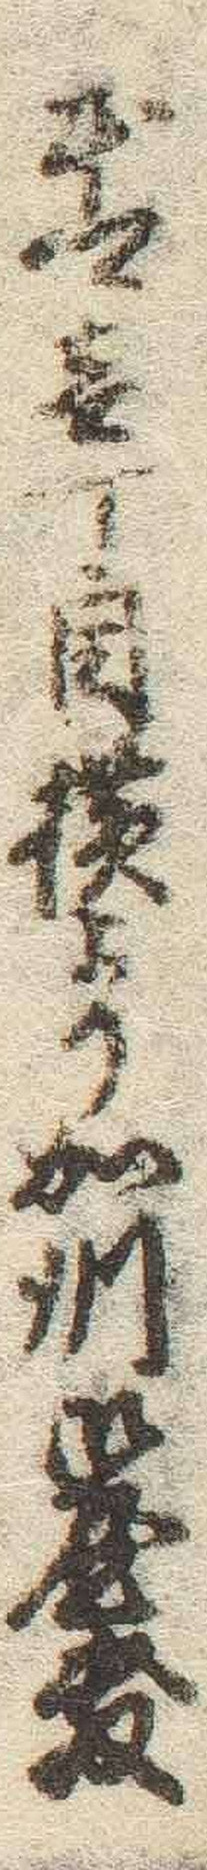本郷壱丁目横より加州御屋敷
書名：江戸町独案内
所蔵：東京学芸大学附属図書館 国文学研究資料館
